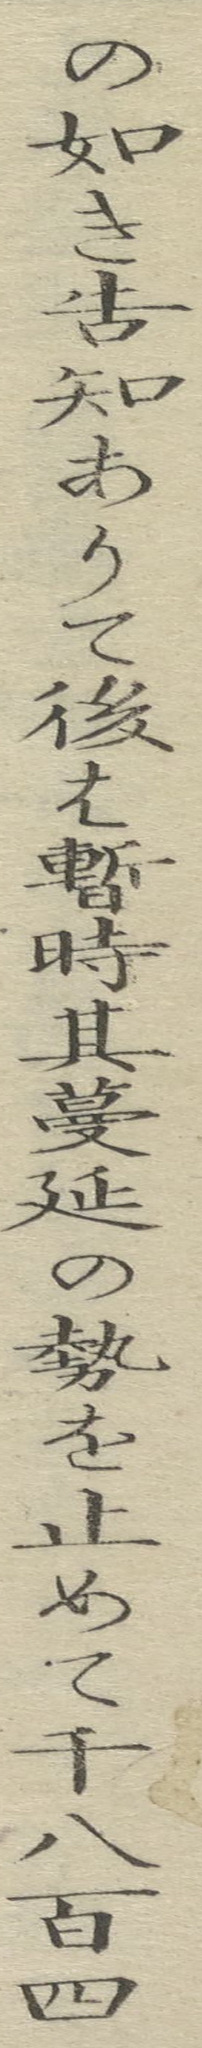の如き告知ありて後は暫時其萬延の勢を止めて千八百四
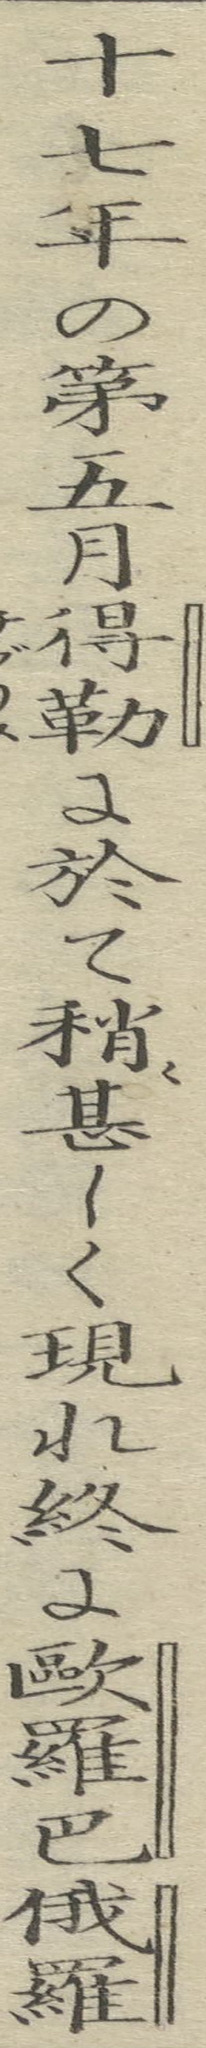十七年の第五月得勒に於て稍甚しく現れ終に欧羅巴俄羅
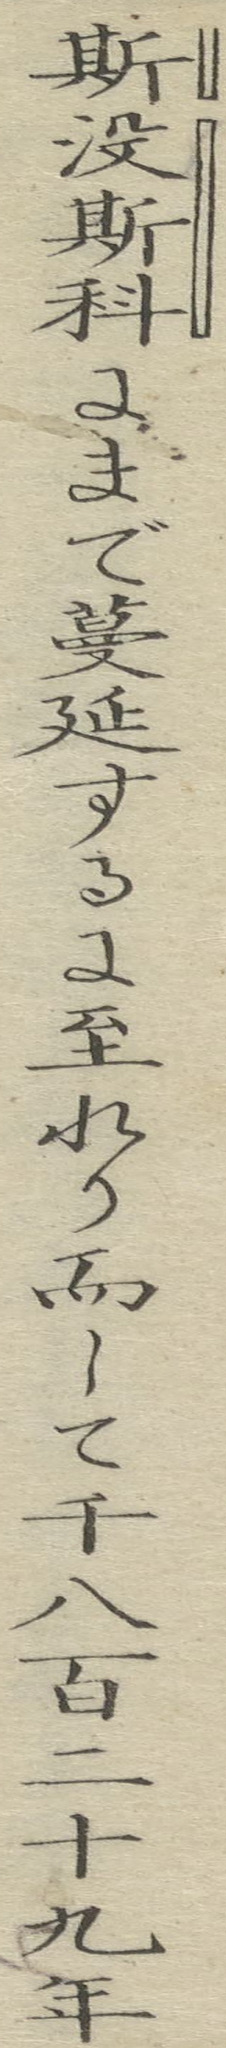斯没斯科にまで萬延するに至れり而して千八百二十九年
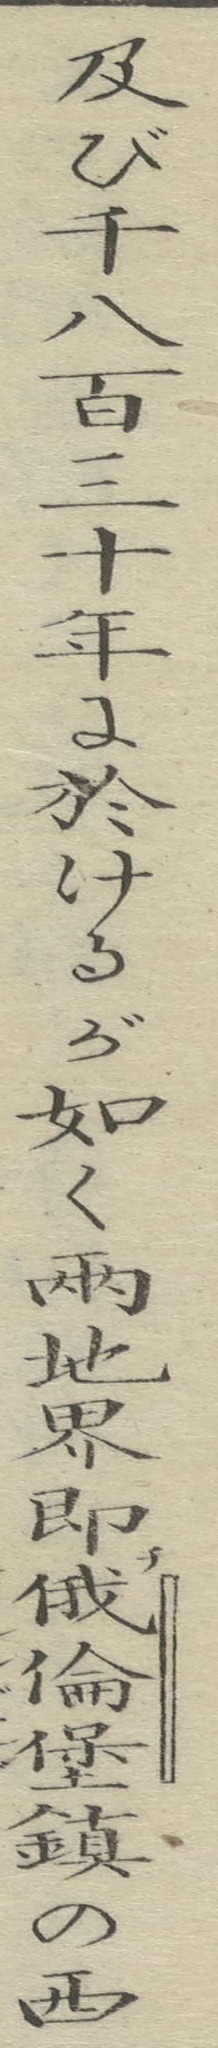及び千八百三十年に於けるが如く両地界即俄倫堡鎮の西
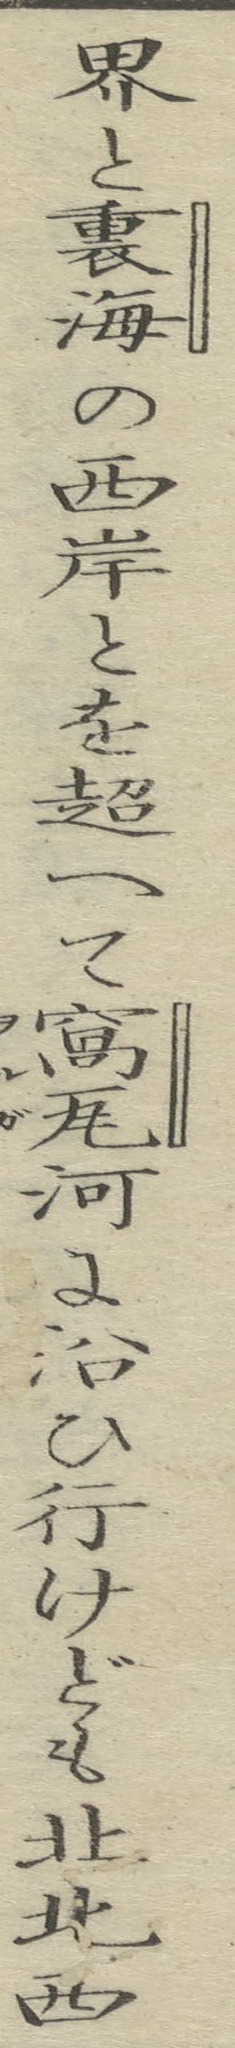界と裏海の西岸とを超へて窩瓦河に沿ひ行けども北北西
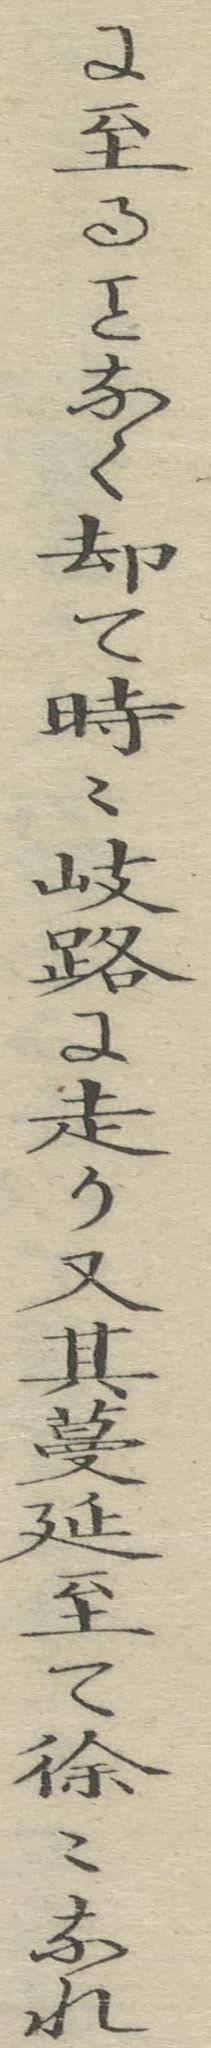に至ることなく却て時々岐路に走り又其萬延至て徐々なれ
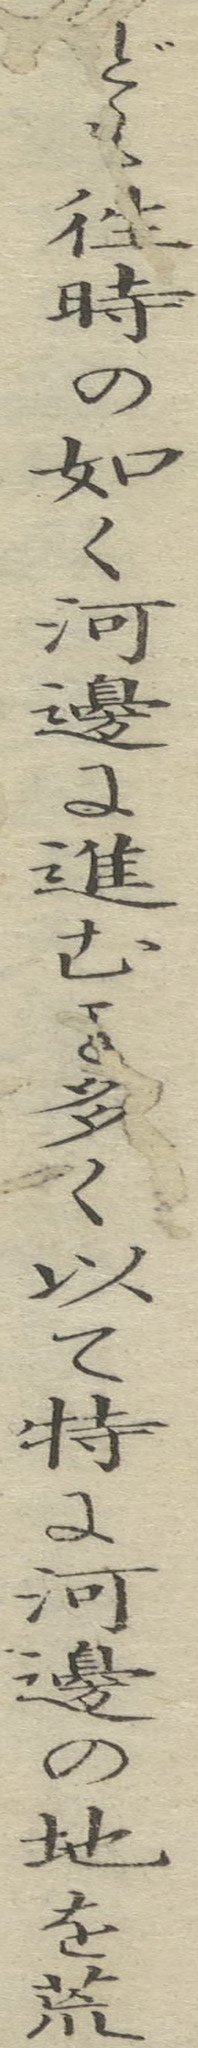ども往時の如く河邊に進むこと多く以て特に河邊の地を荒
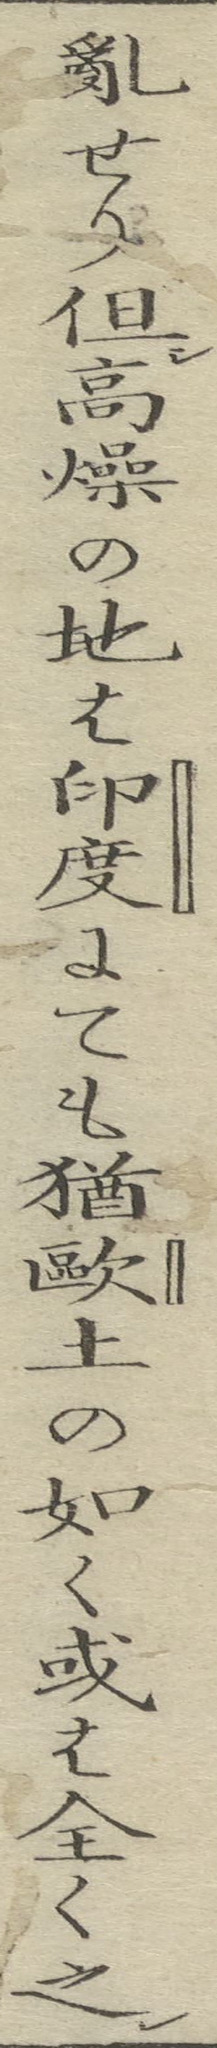亂せり但高燥の地は印度にても猶欧土の如く或は全く之
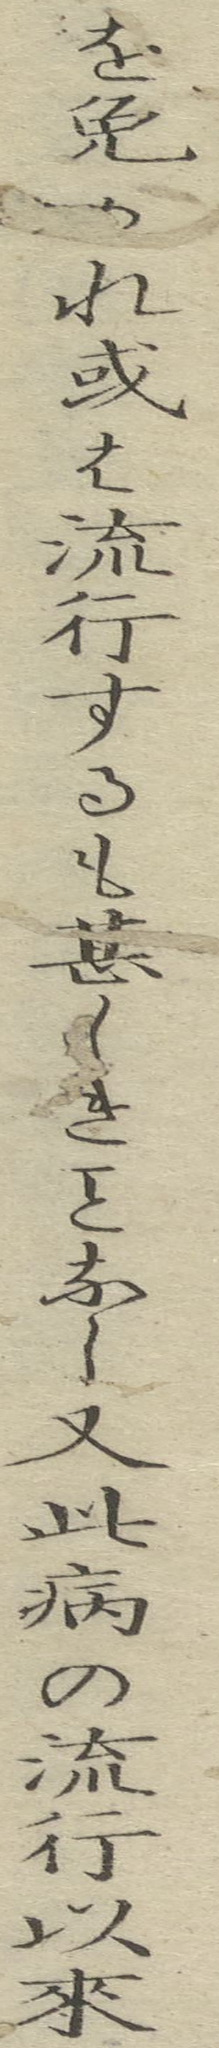を免かれ或は流行するも甚しきことなし又此病の流行以來

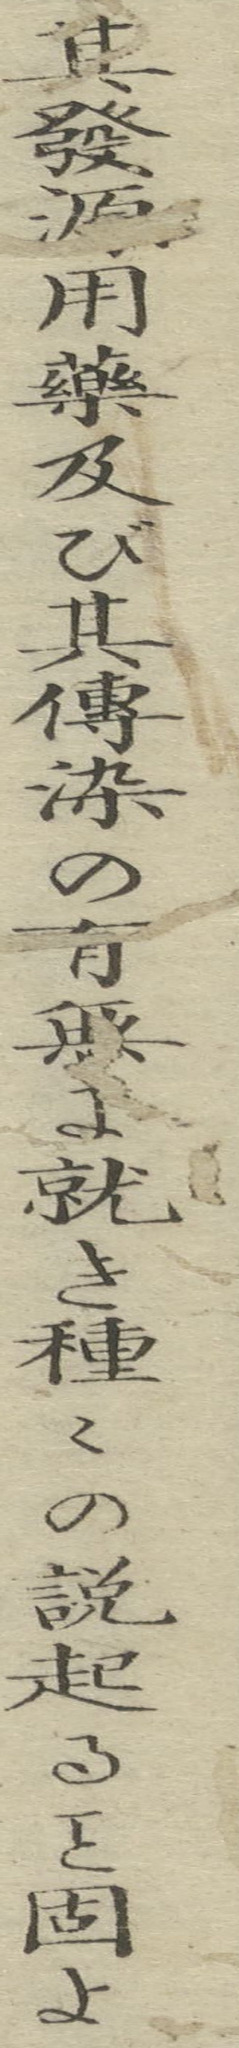其發源用藥及び其傅染の有無に就き種々の説起ること固よ
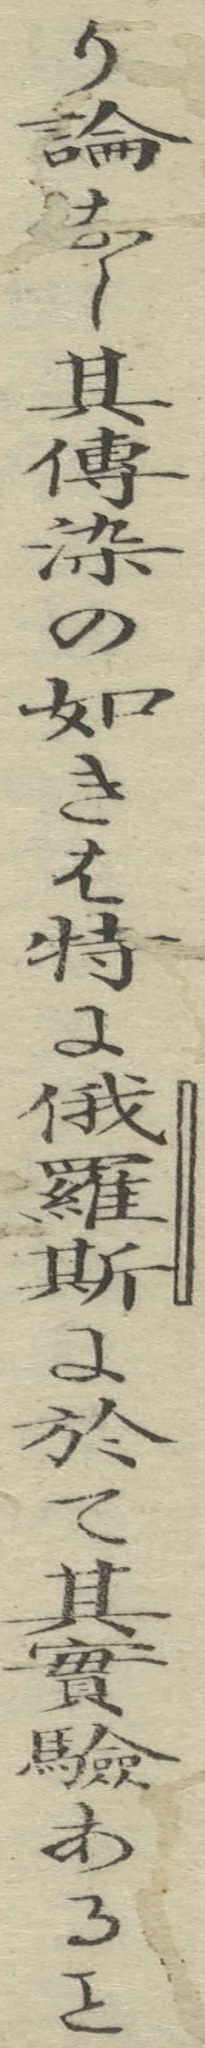り論なし其傅染の如きは特に俄羅斯に於て其實驗あること
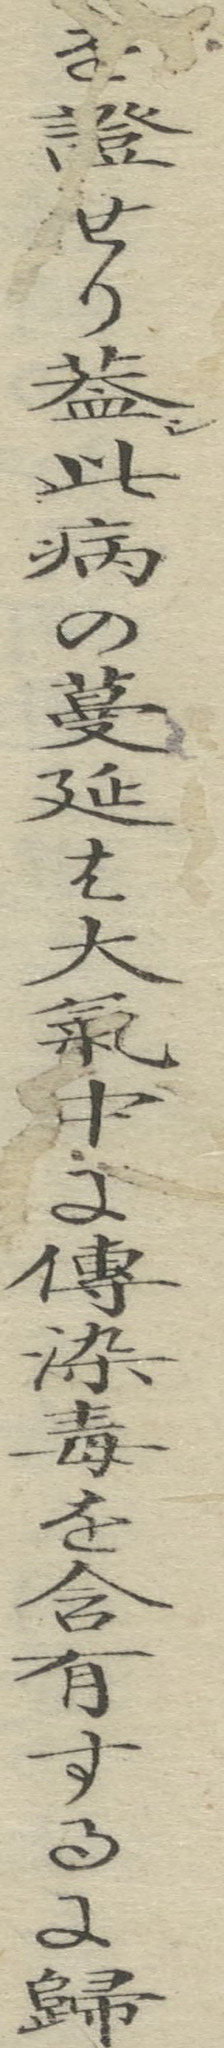を證せり葢此病の萬延は大氣中に傅染毒を含有するに歸
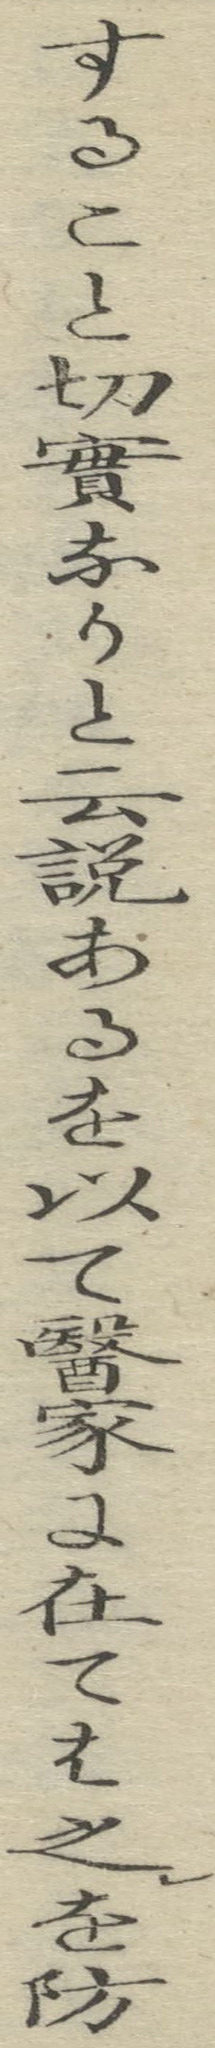すること切實なりと伝説あるを以て醫家に在ては之防
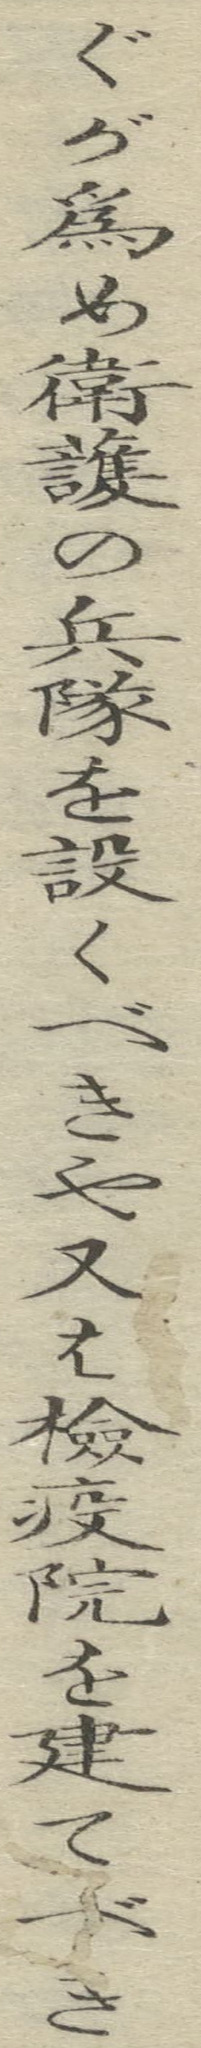ぐが為に衛護の兵隊を設くべきや又は検疫院を建てべき
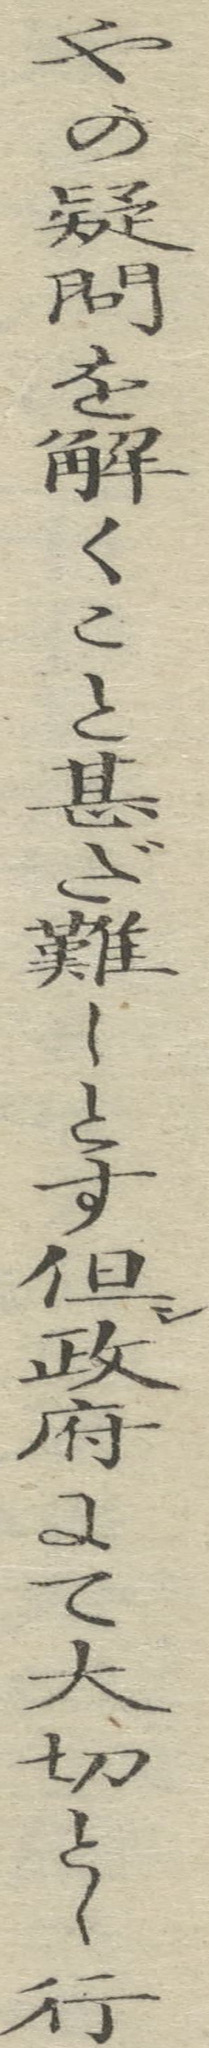やの疑問を解くこと甚だ難しとす但政府にて大切とし行
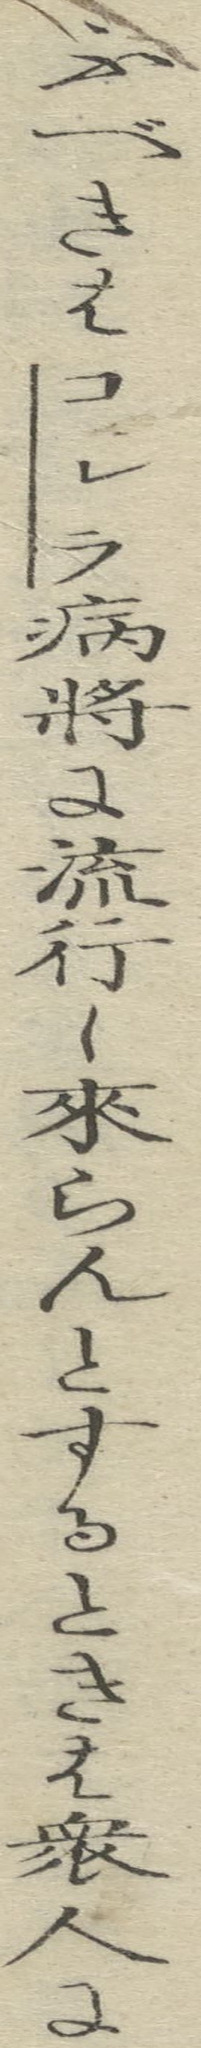ふべきはコレラ病将に流行し來らんとするときは衆人に
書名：官版疫毒預防説　全
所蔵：東京大学総合図書館 General Library in the University of Tokyo, JAPAN
